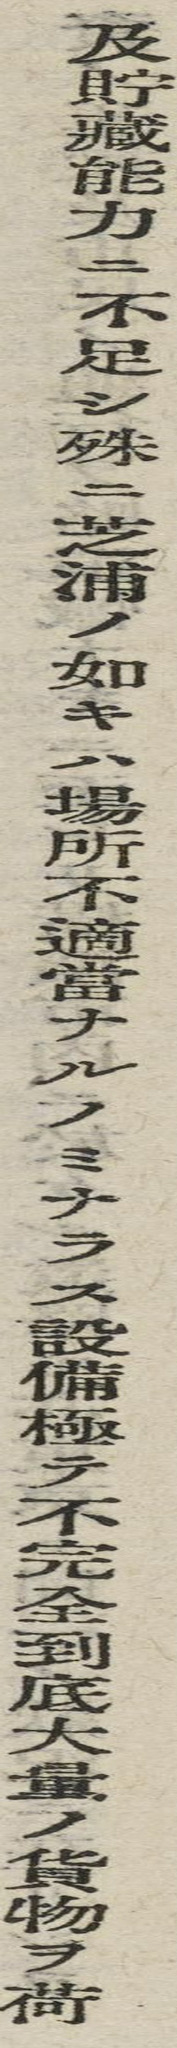及貯蔵能力ニ不足シ殊ニ芝浦ノ如キハ場所不適当ナルノミナラス設備極テ不完全到底大量ノ貨物ヲ荷
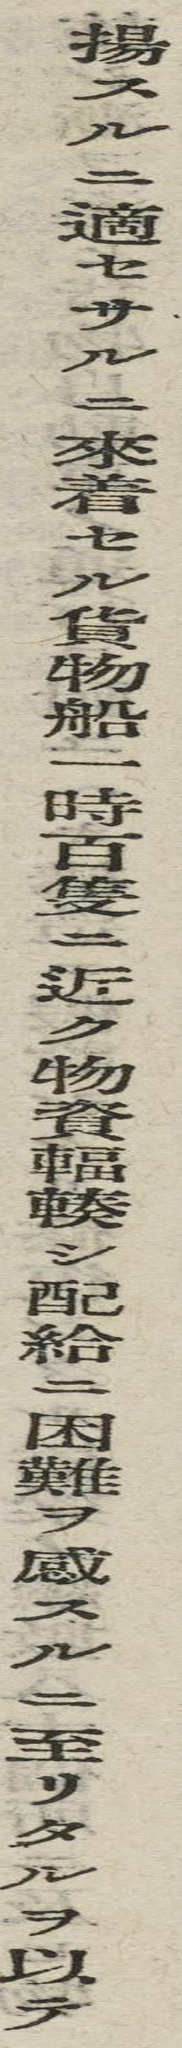揚スルニ適セサルニ来着セル貨物船一時百隻ニ近ク物資輻輳シ配給ニ困難ヲ感スルニ至リタルヲ以テ
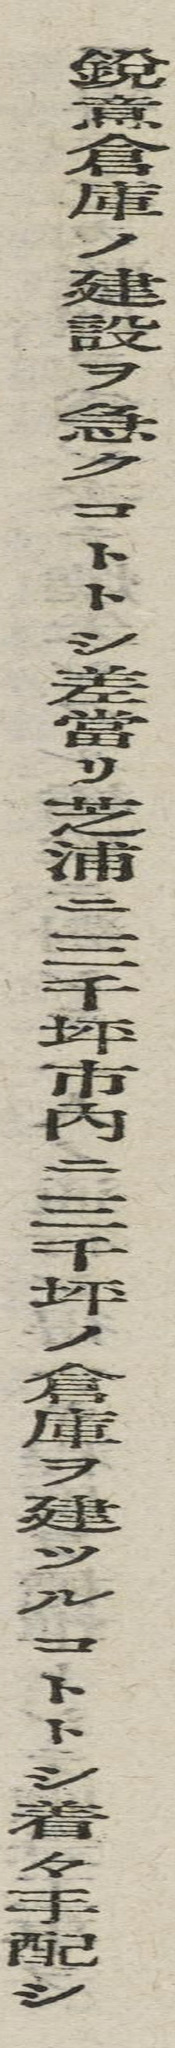鋭意倉庫ノ建設ヲ急クコトトシ差当リ芝浦ニ三千坪市内ニ三千坪ノ倉庫ヲ建ツルコトトシ着々手配シ
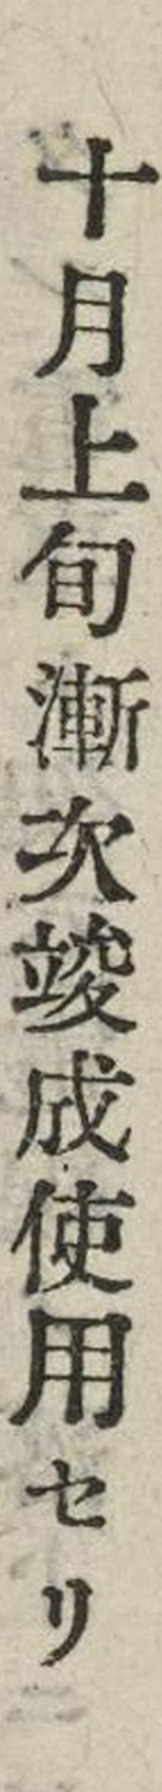十月上旬漸次竣成使用セリ
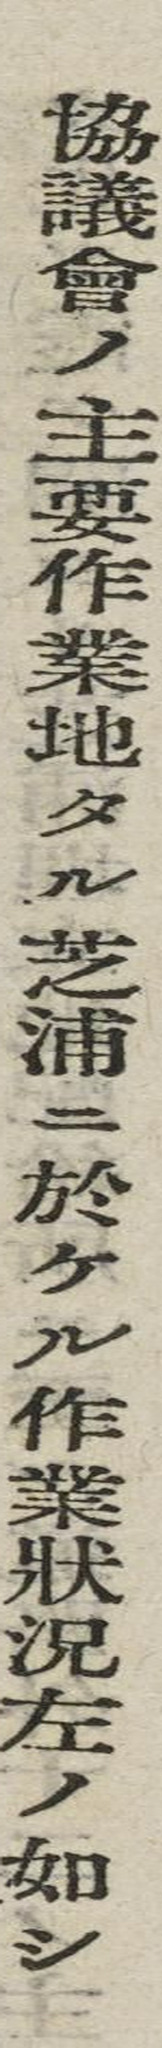協議会ノ主要作業地タル芝浦ニ於ケル作業状況左ノ如シ
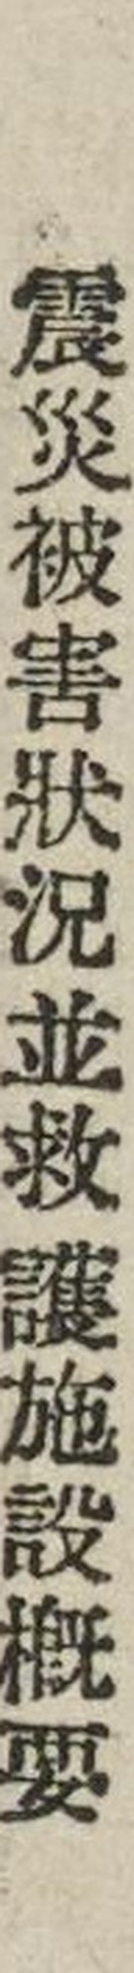震災被害状況並救護施設概要

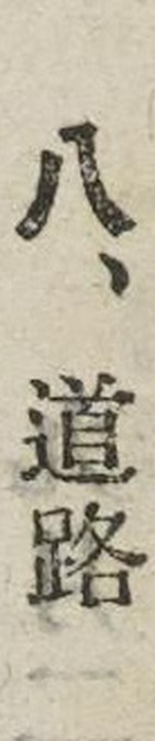八、道路
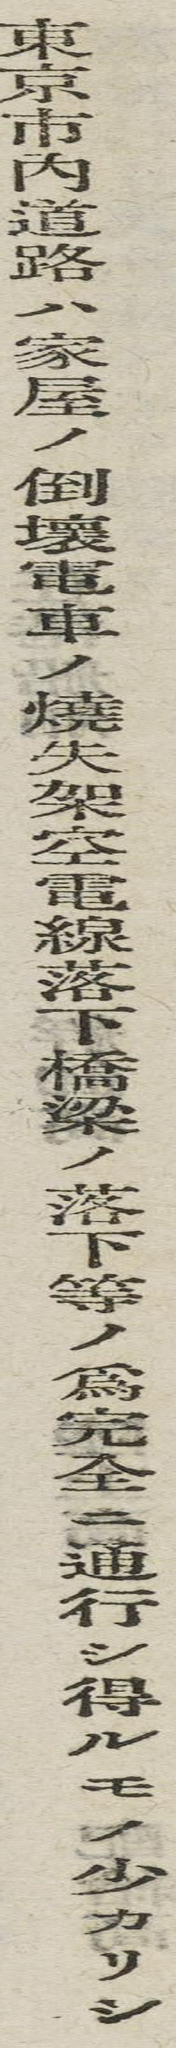東京市内道路ハ家屋ノ倒壊電車ノ焼失架空電線落下橋梁ノ落下等ノ為完全ニ通行シ得ルモノ少カリシ
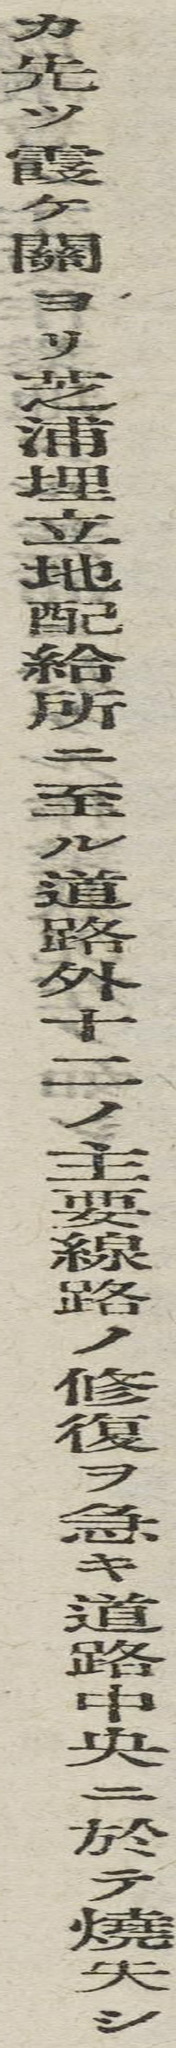カ先ツ霞ヶ関ヨリ芝浦埋立地配給所ニ至ル道路外十二ノ主要線路ノ修復ヲ急キ道路中央ニ於テ焼失シ
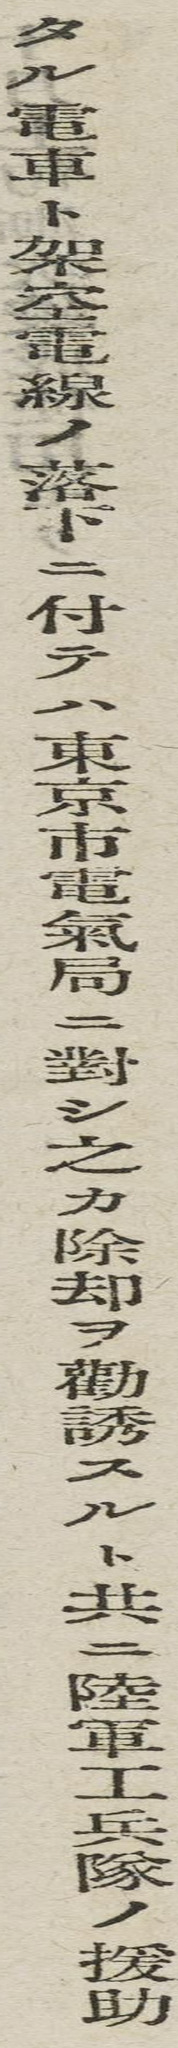タル電車ト架空電線ノ落下ニ付テハ東京市電気局ニ対シ之カ除却ヲ勧誘スルト共ニ陸軍工兵隊ノ援助
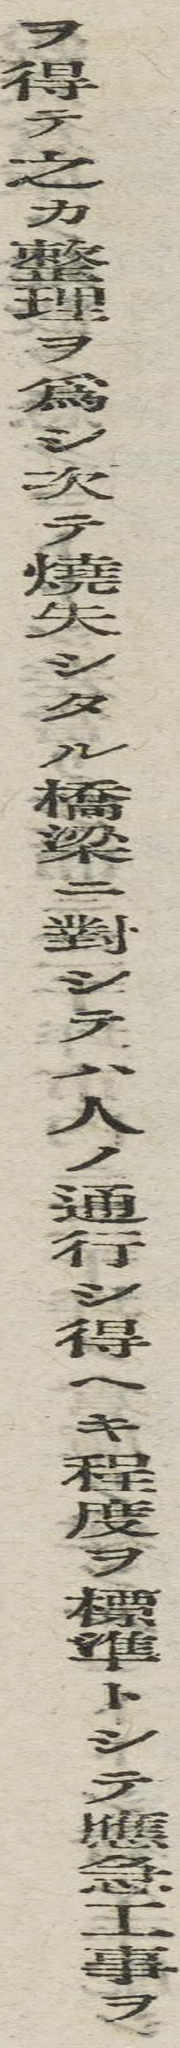ヲ得テ之カ整理ヲ為シ次テ焼失シタル橋梁ニ対シテハ人ノ通行シ得ヘキ程度ヲ標準トシテ応急工事ヲ
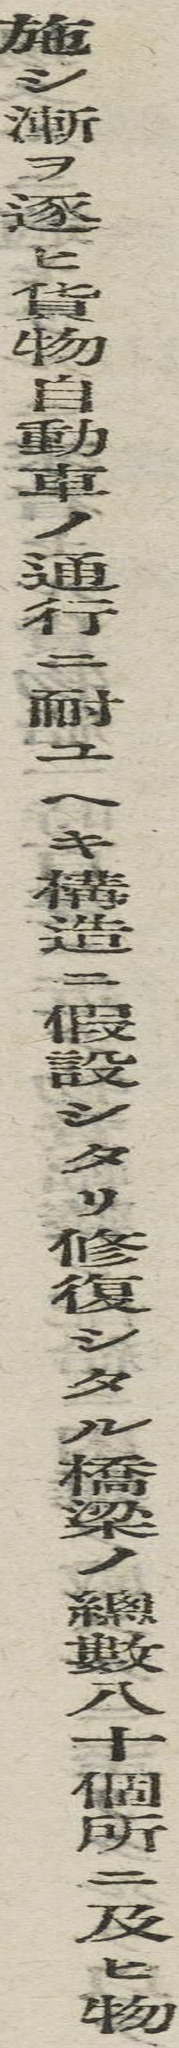施シ漸ヲ遂ヒ貨物自動車ノ通行ニ耐ユヘキ構造ニ仮設シタリ修復シタル橋梁ノ総数八十箇所ニ及ヒ物
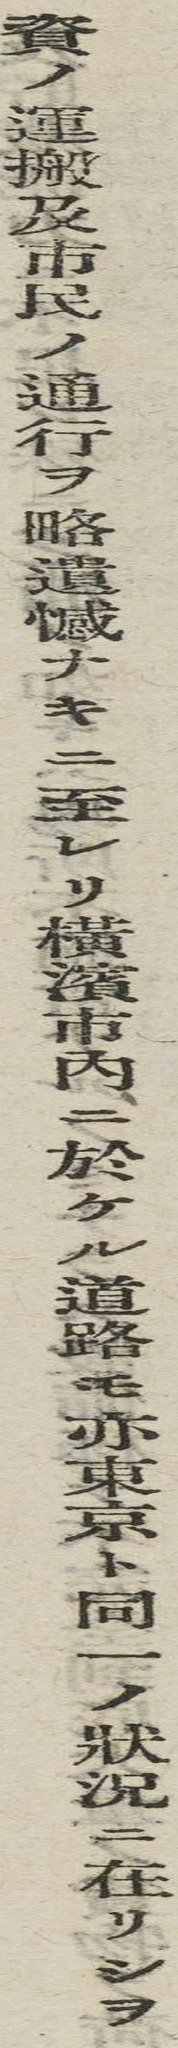資ノ運搬及市民ノ通行ヲ略遺憾ナキニ至レリ横浜市内ニ於ケル道路モ亦東京ト同一ノ状況ニ在リシヲ
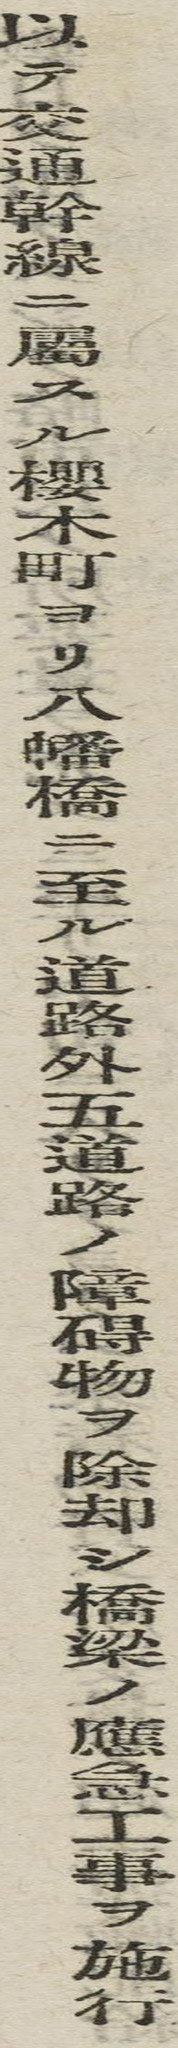以テ交通幹線ニ属スル桜木町ヨリ八幡橋ニ至ル道路外五道路ノ障碍物ヲ除却シ橋梁ノ応急工事ヲ施行
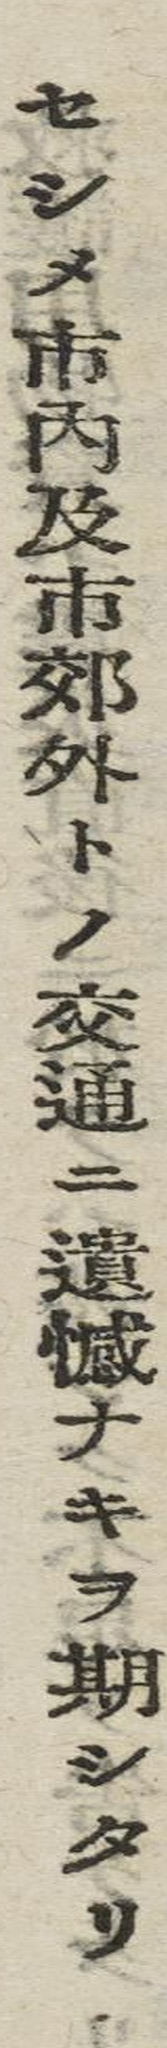セシメ市内及市郊外トノ交通ニ遺憾ナキヲ期シタリ
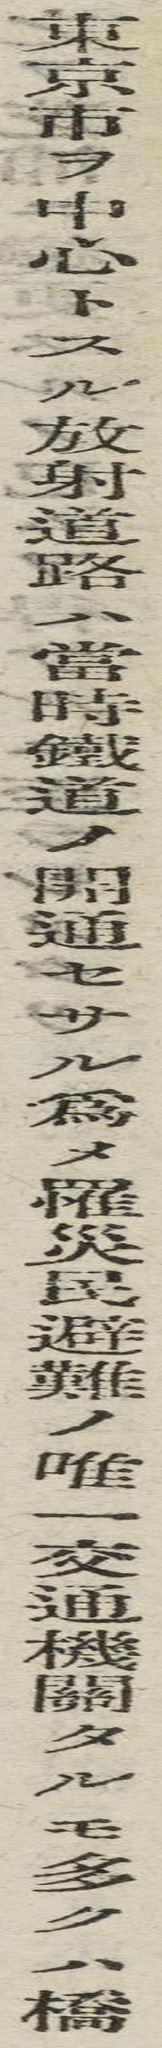東京市ヲ中心トスル放射道路ハ当時鉄道ノ開通セサル為メ罹災民避難ノ唯一交通機関タルモ多クハ橋
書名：震災被害状況並救護施設概要
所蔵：東京大学地震研究所図書室 Earthquake Research Institute Library, The University of Tokyo, JAPAN
